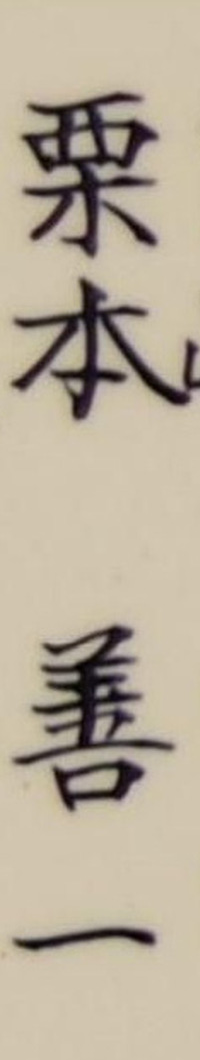栗本善一

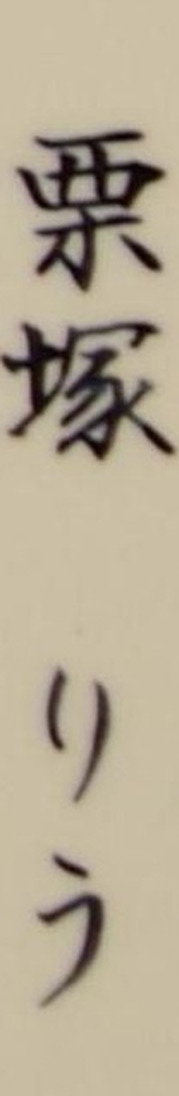栗塚りう
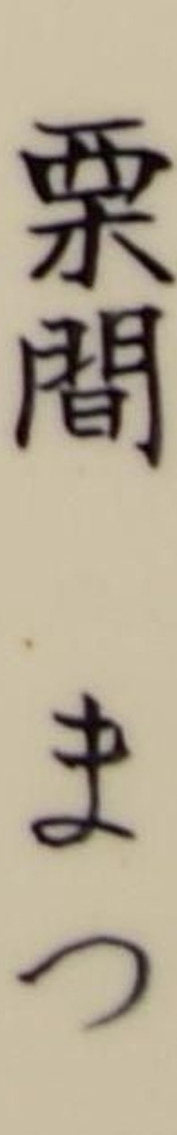栗間まつ
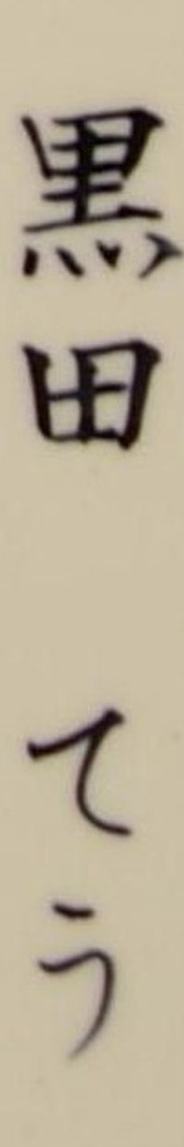黒田てう
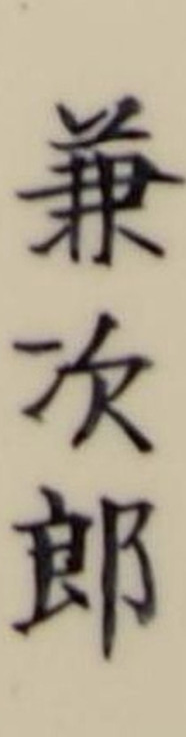兼次郎
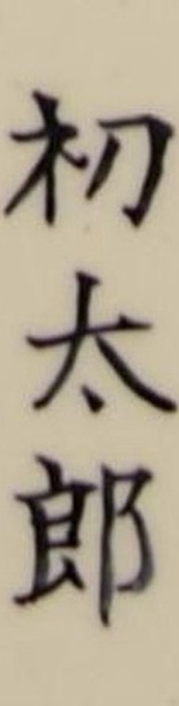初太郎
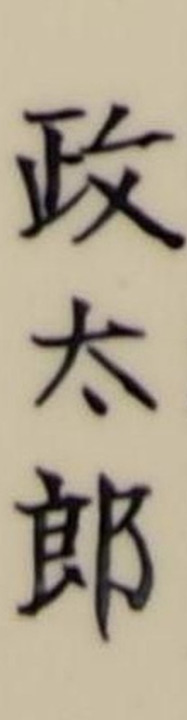政太郎

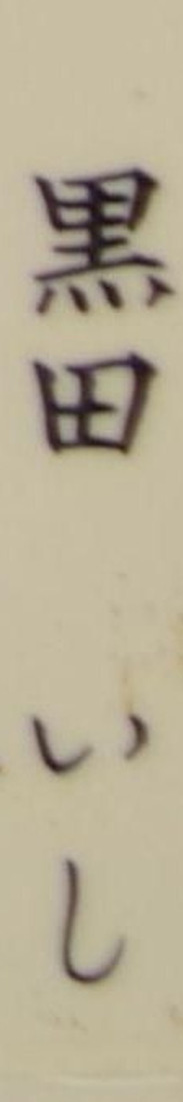黒田いし
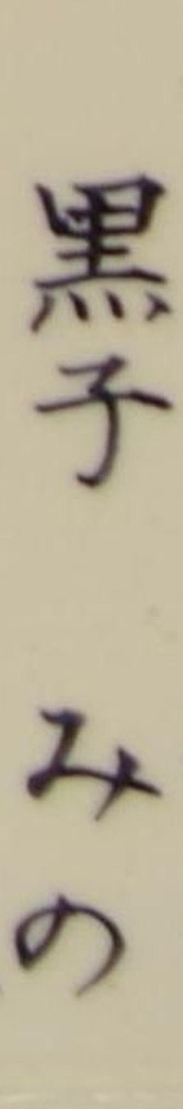黒子みの
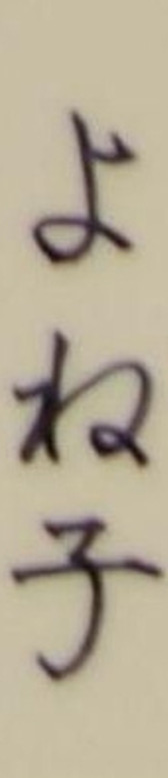よね子
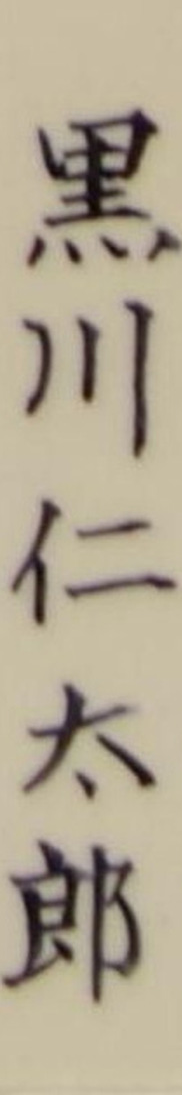黒川仁太郎
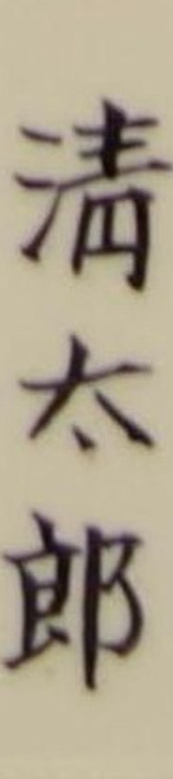清太郎
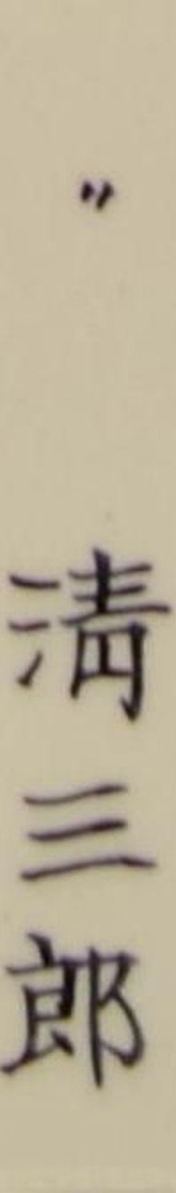清三郎
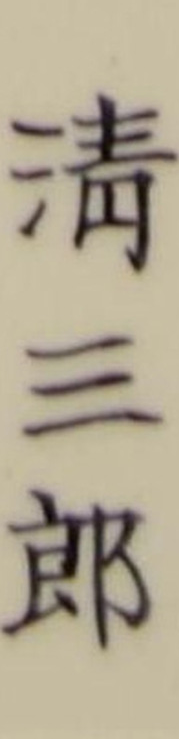清三郎
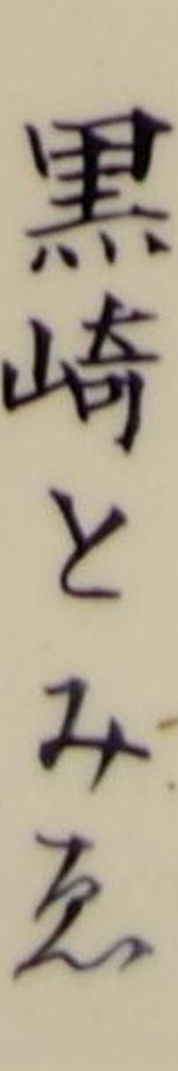黒崎とみゑ
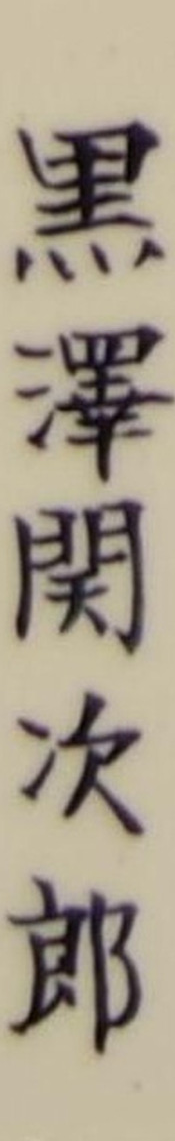黒澤閉次郎
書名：A~D
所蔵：koyasan kongobuji
